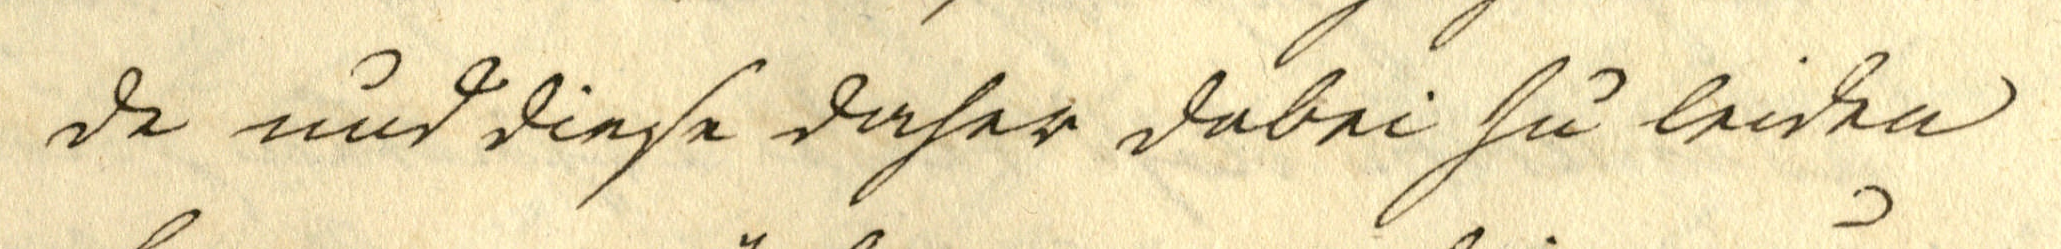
de und diese daher dabei zu leiden
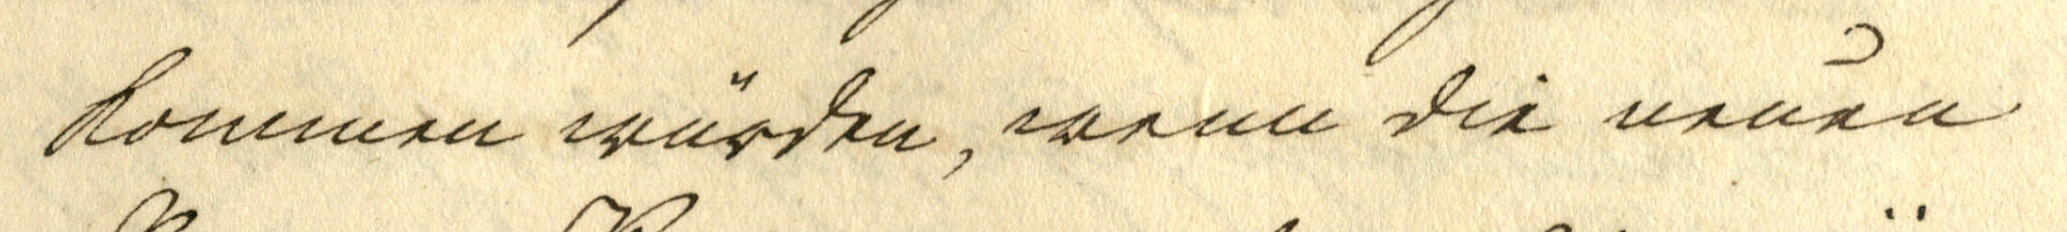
kommen würden, wenn die neuen
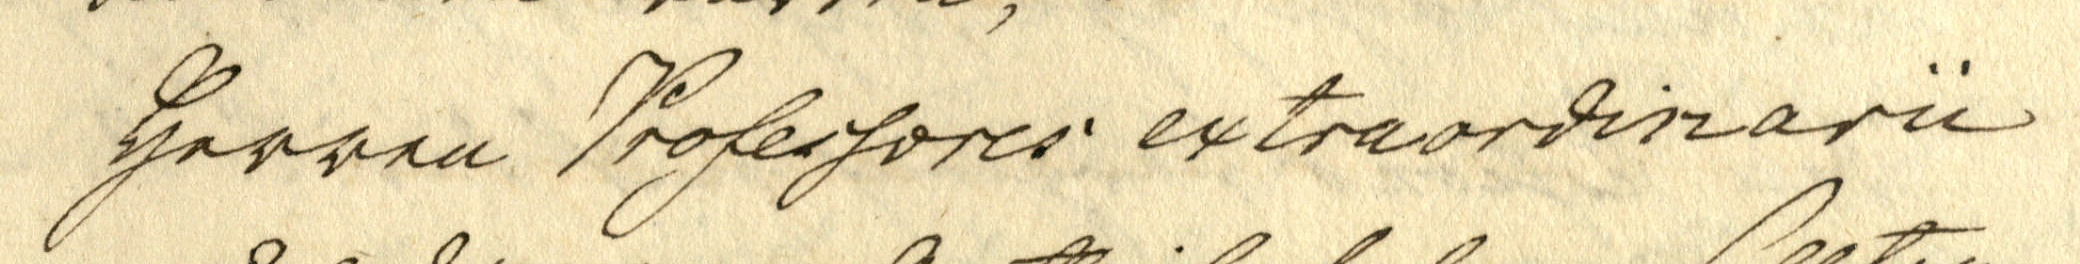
Herren Professores extraordinarii
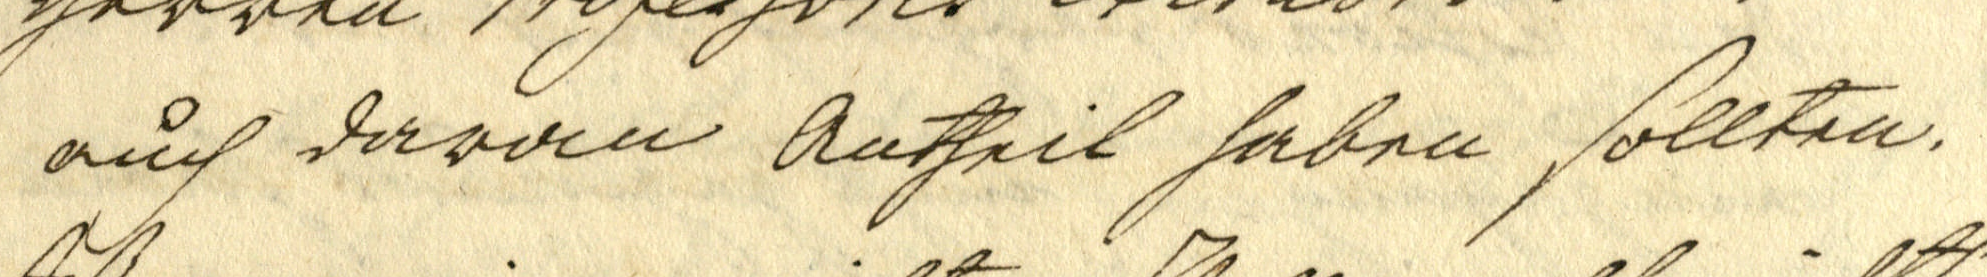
auch daran Antheil haben sollten.
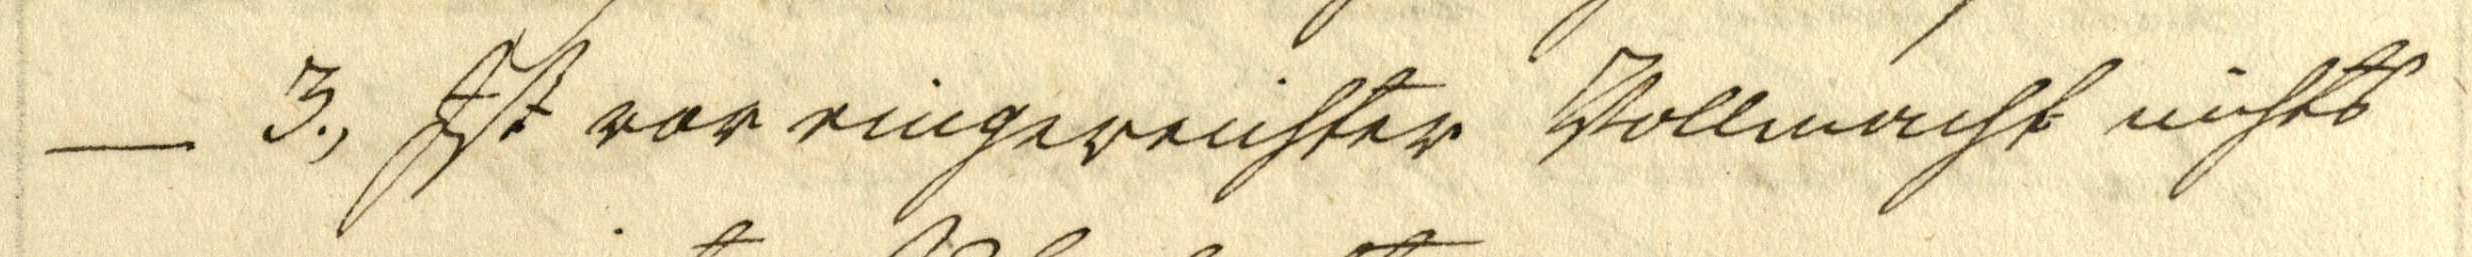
3., Ist vor eingereichter Vollmacht nichts
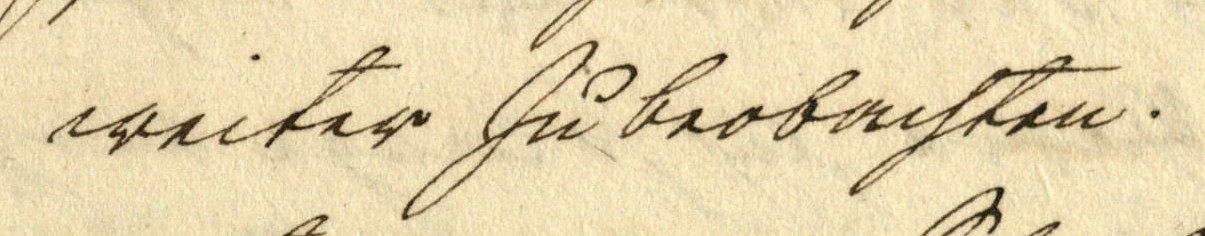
weiter zu beobachten.
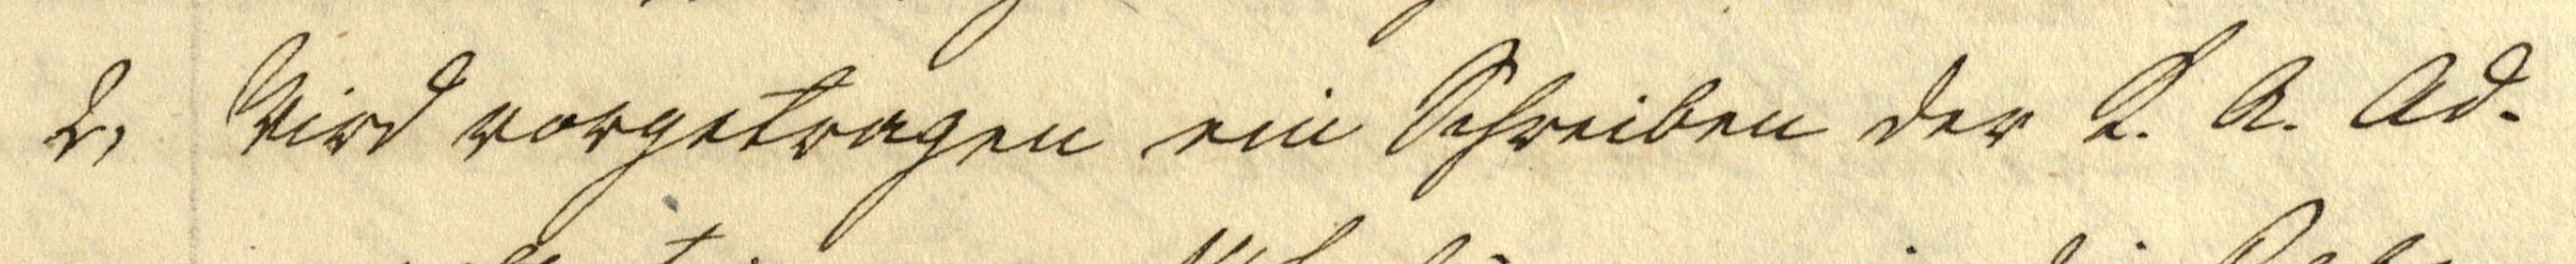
2, Wird vorgetragen ein Schreiben der K. A. Ad¬
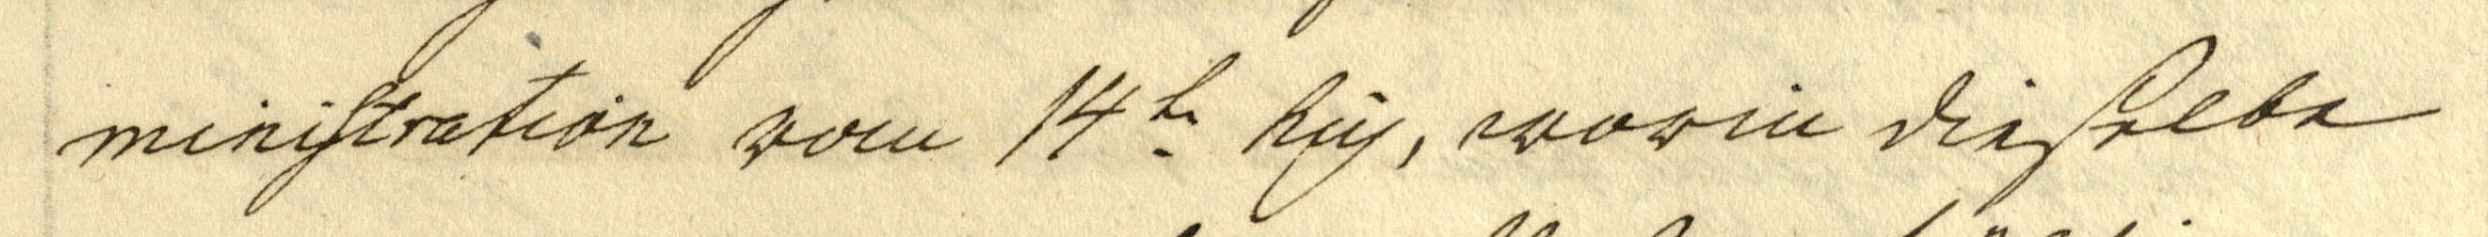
ministration vom 14 ten huj, worin dieselbe
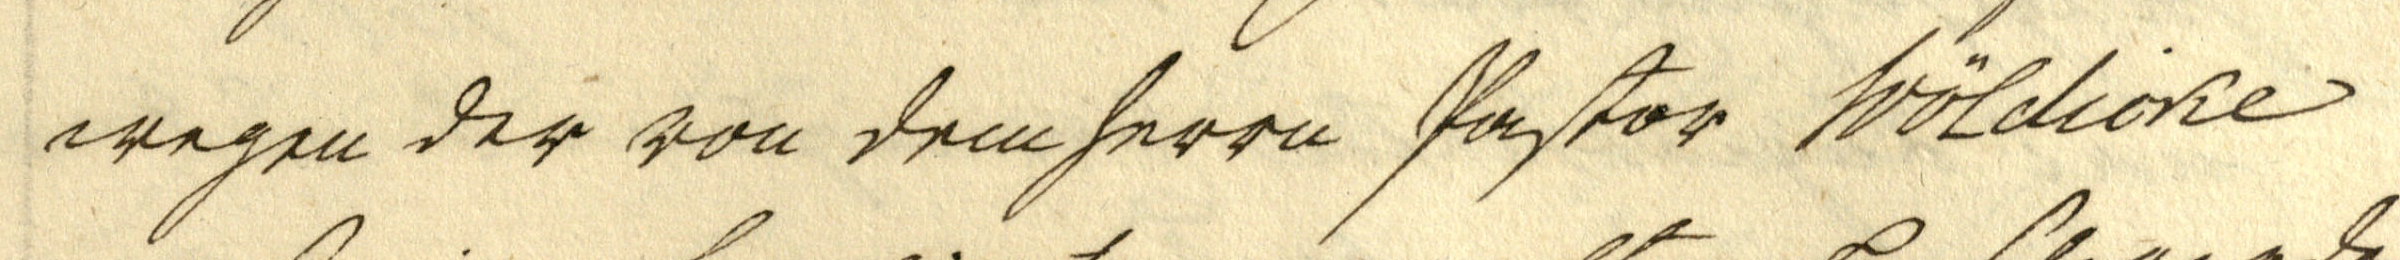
wegen der von dem Herrn Pastor Wöldicke
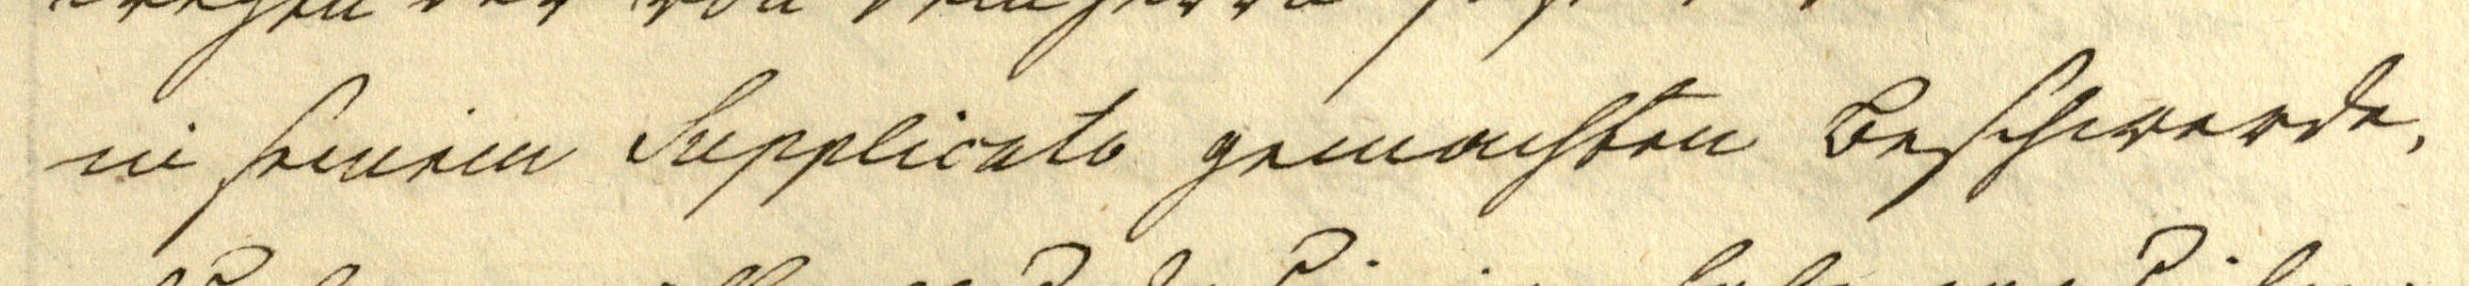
in seinem Supplicato gemachten Beschwerde,
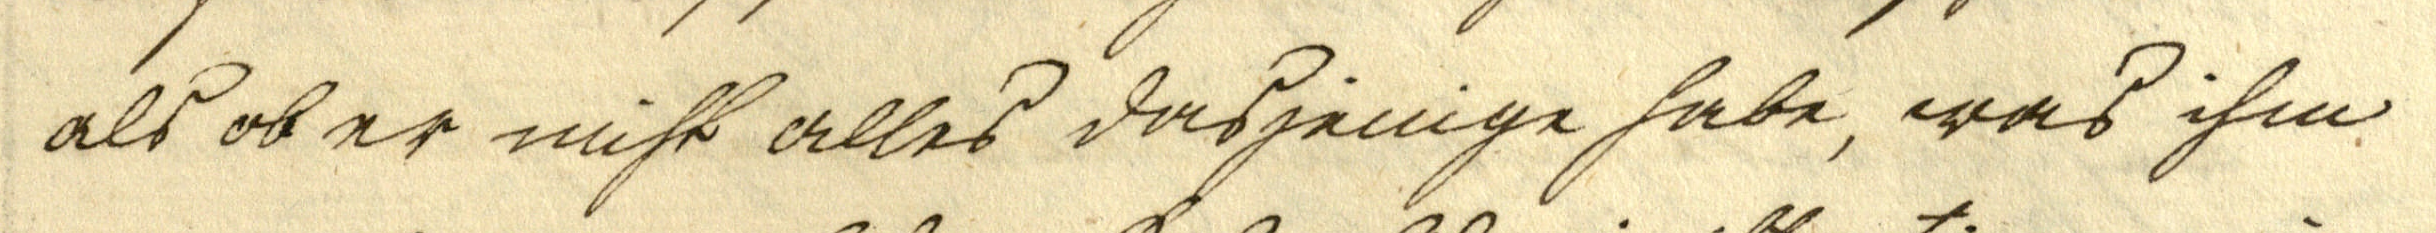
als ob er nicht alles dasjenige habe, was ihm
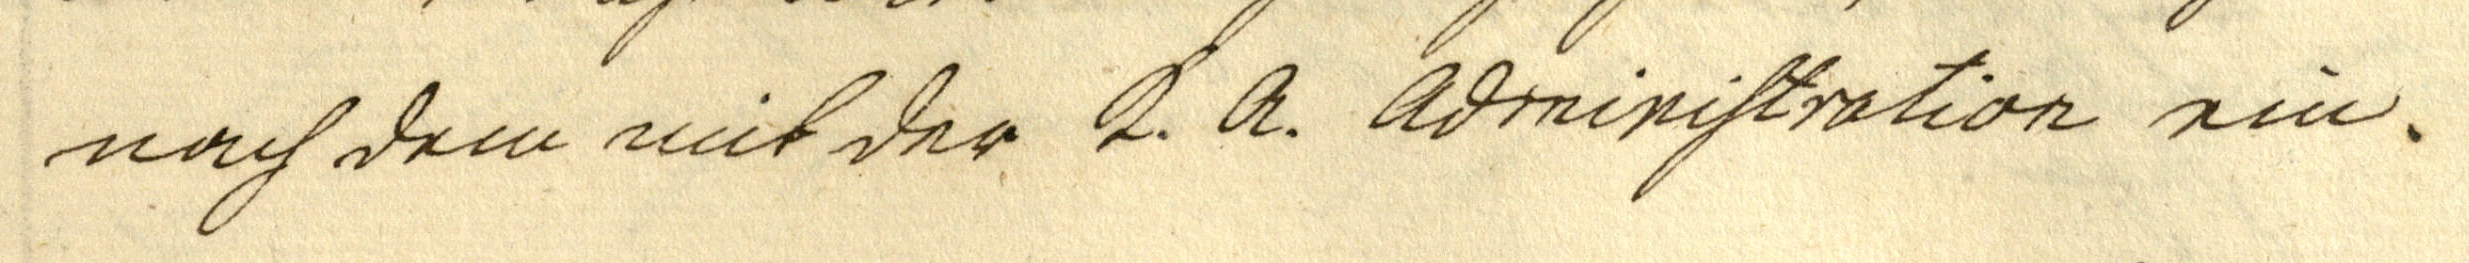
nach dem mit der K. A. Administration ein¬
